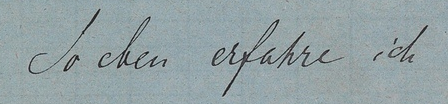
Soeben erfahre ich
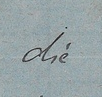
Herr
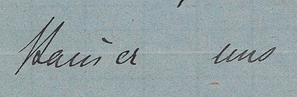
Hammer uns
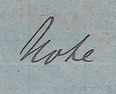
Note
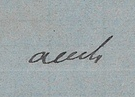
eingeschickt hat.
